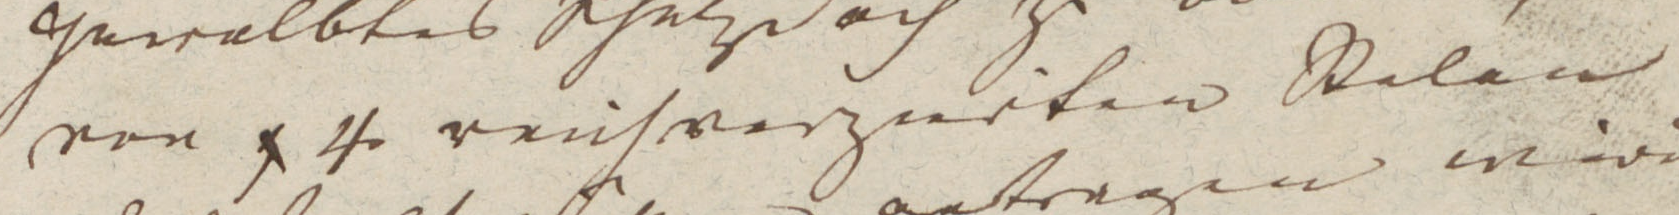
von 4 reichverzierten Stelen
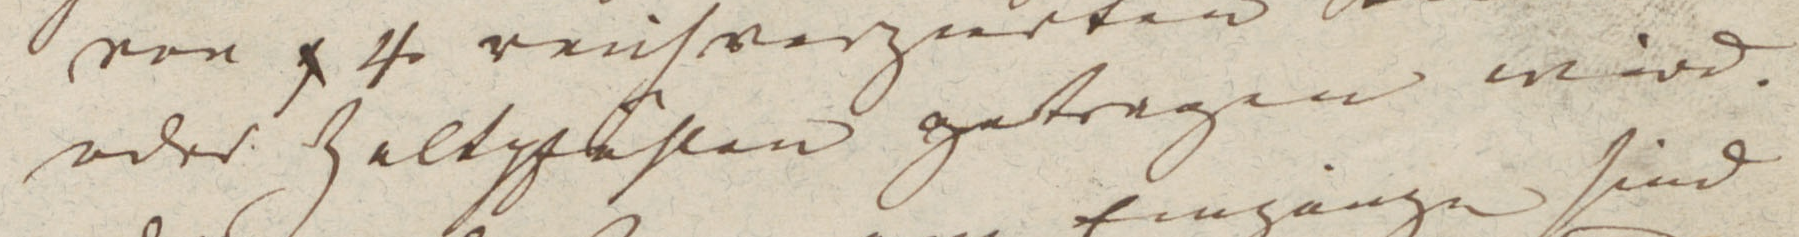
oder Zeltpfählen getragen wird.
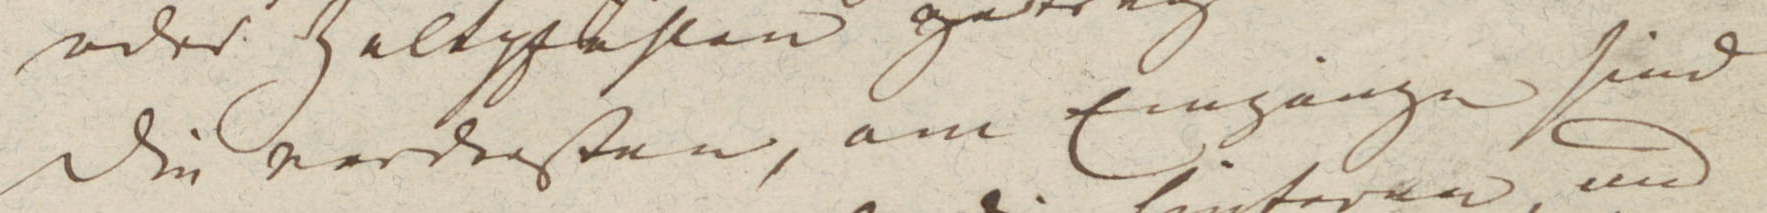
Die vordersten, am Eingange sind
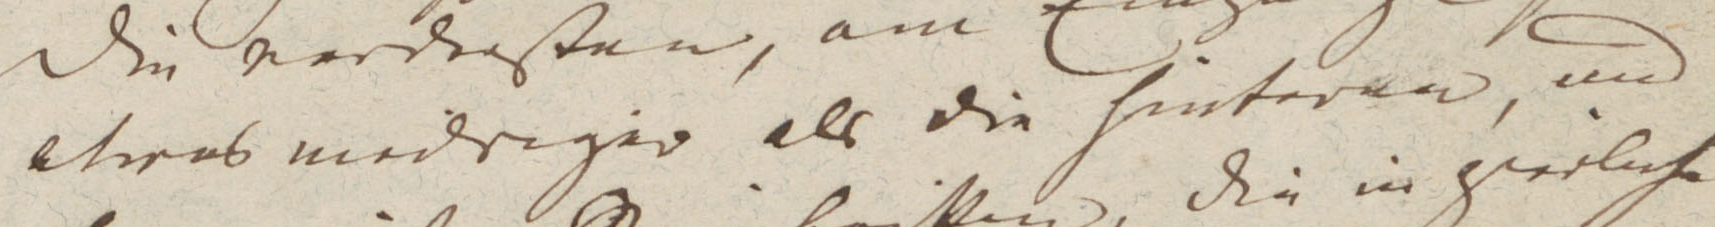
etwas niedriger als die hinteren, und
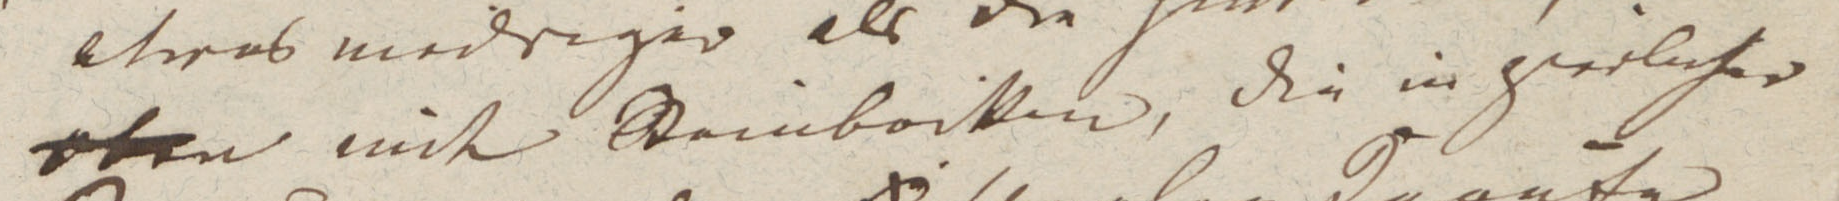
oben mit Steinbioken, die in zierlicher
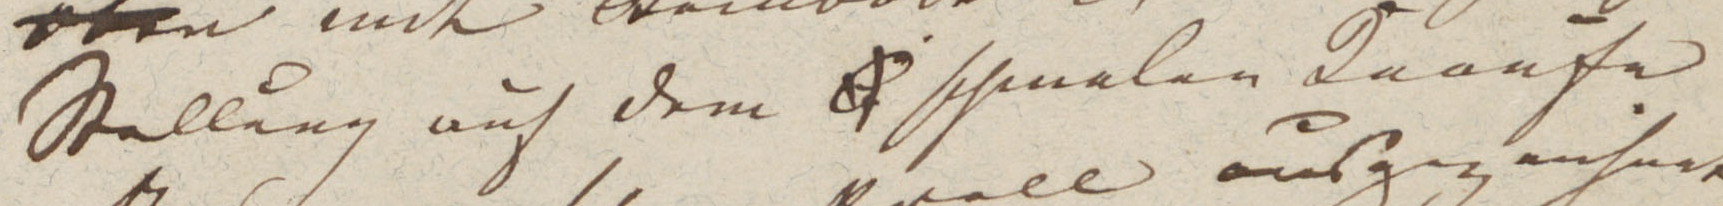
Stellung auf dem B schmalen Knaufe
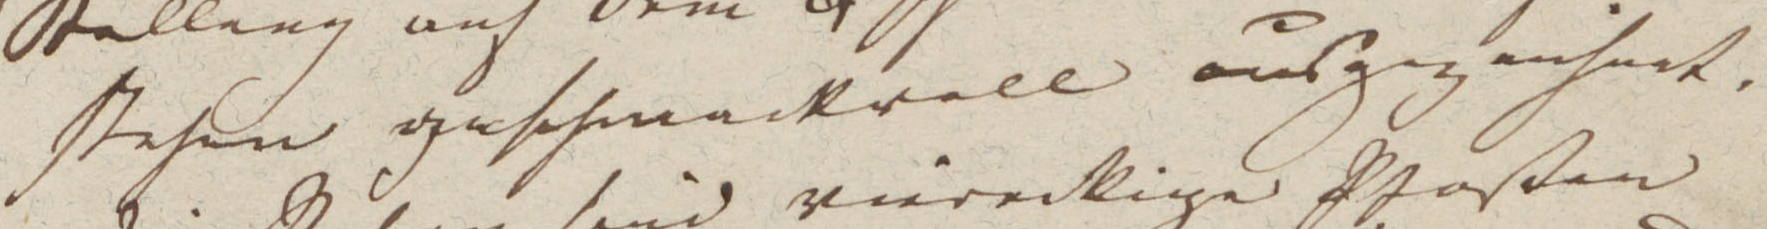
stehen geschmackvoll ausgezeichnet.
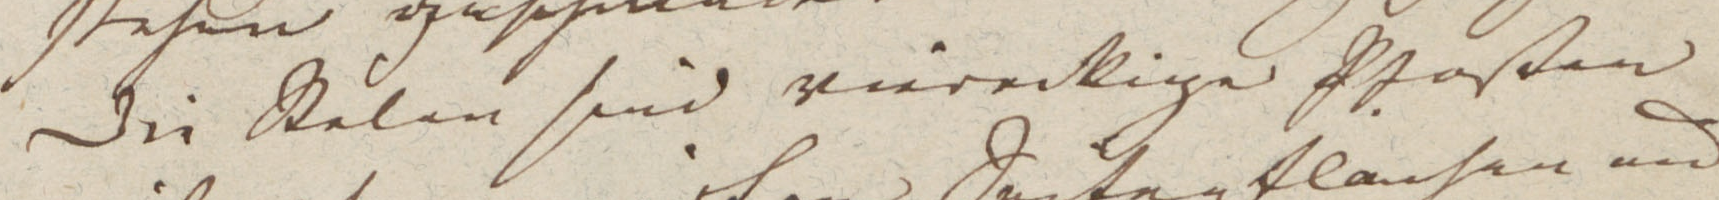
Die Stelen sind viereckige Pfosten
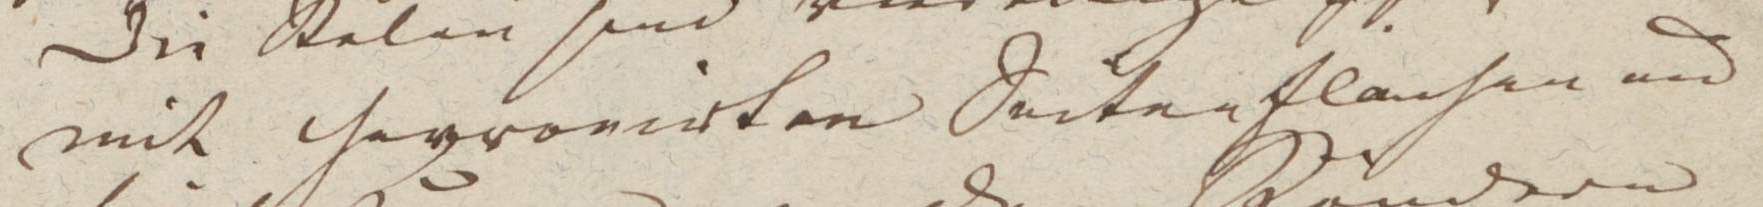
mit chevronirten Seitenflächen und
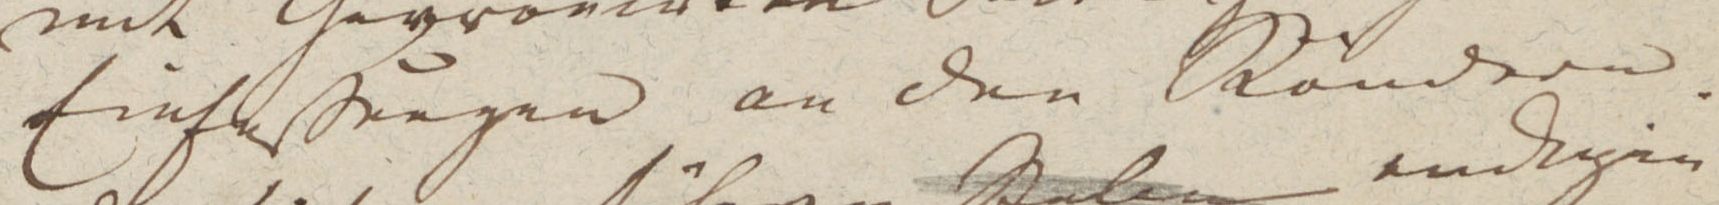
Einfassungen an den Rändern.
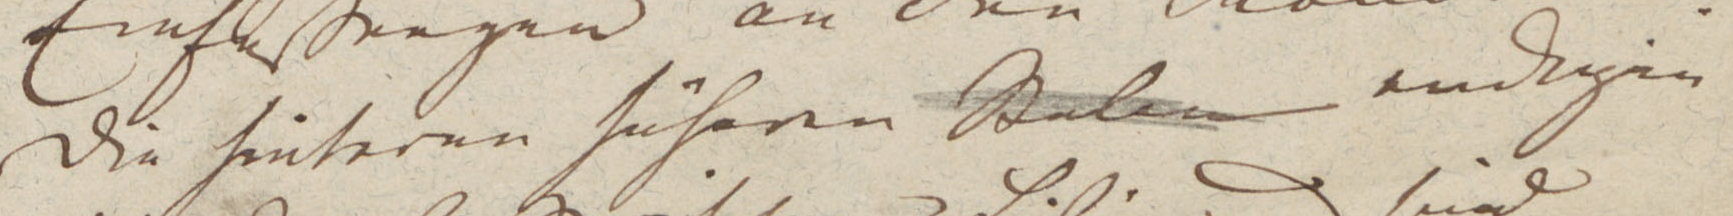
Die hinteren höheren Stelen endigen
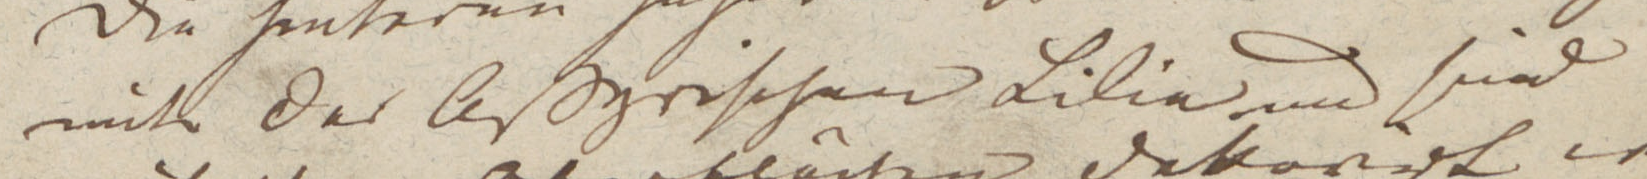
mit der Assyrischen Lilie und sind
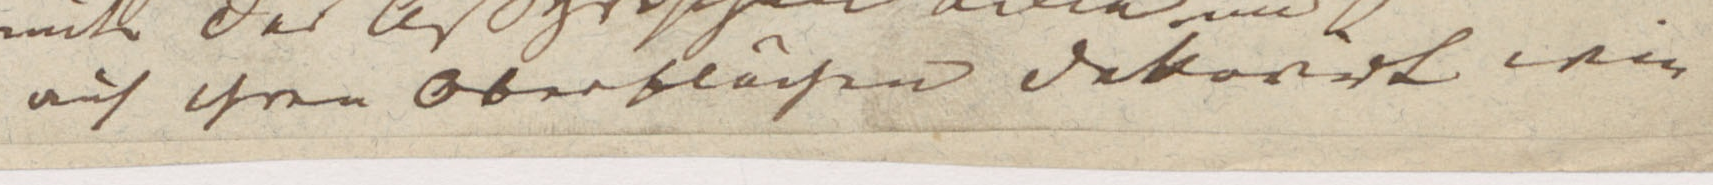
auf ihren Oberflächen dekorirt wie
